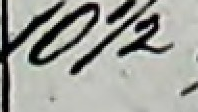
10 1/2
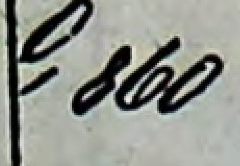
0,860
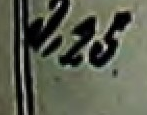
5,25
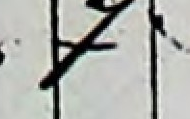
7
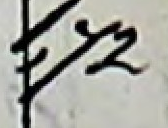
1,72
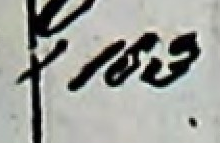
0,153
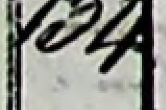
134
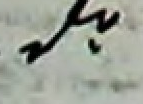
Do
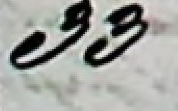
33
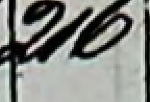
216
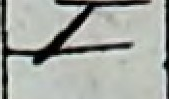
I
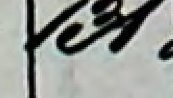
131
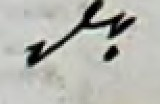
Do
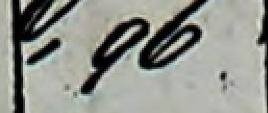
0,96
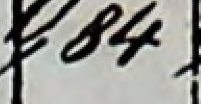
0,84
